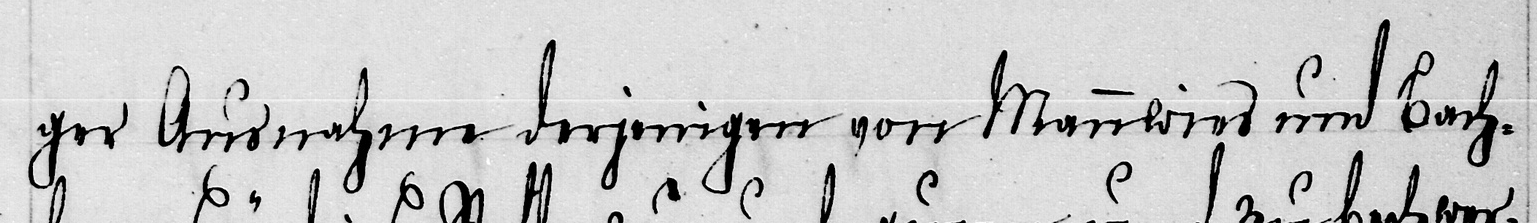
ger Ausnahme derjenigen von Mannwies und Bach¬
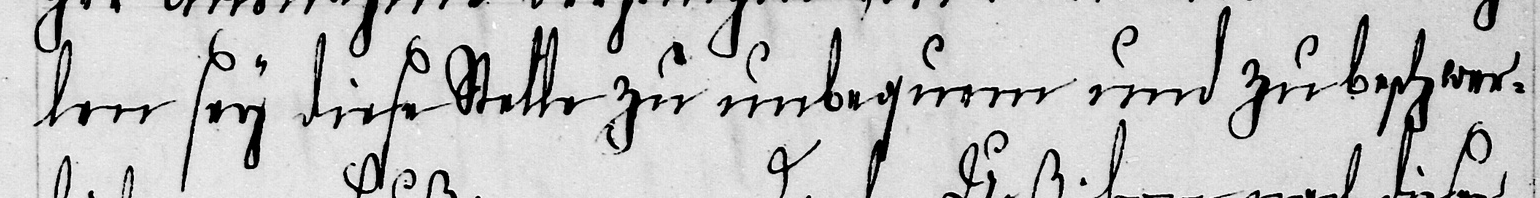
len sey diese Stelle zu unbequem und zu beschwer¬
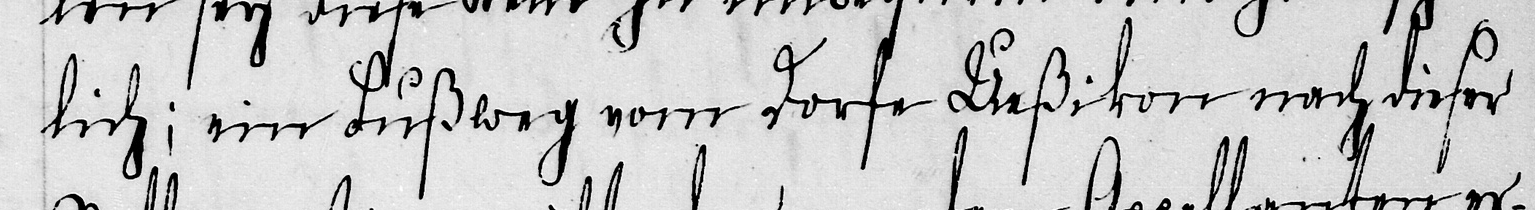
lich; ein Fußweg vom Dorfe Ueßikon nach dieser
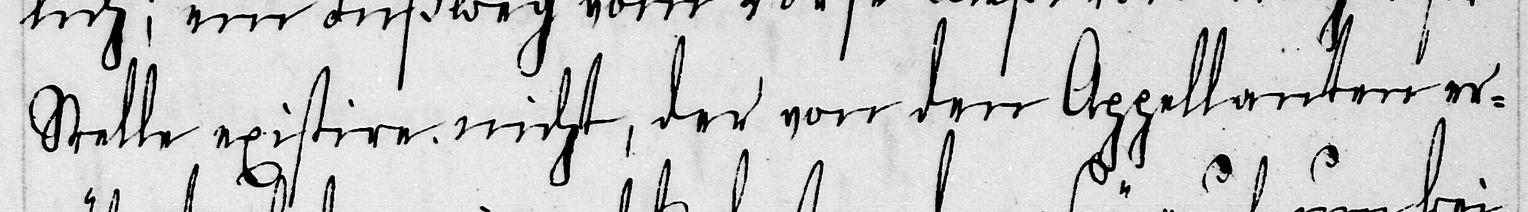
Stelle existire nicht, der von den Appellanten er¬
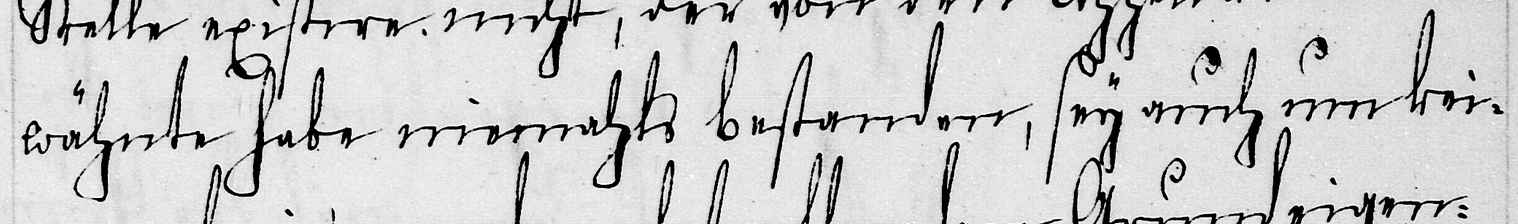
wähnte habe niemahls bestanden, sey auch um kei¬
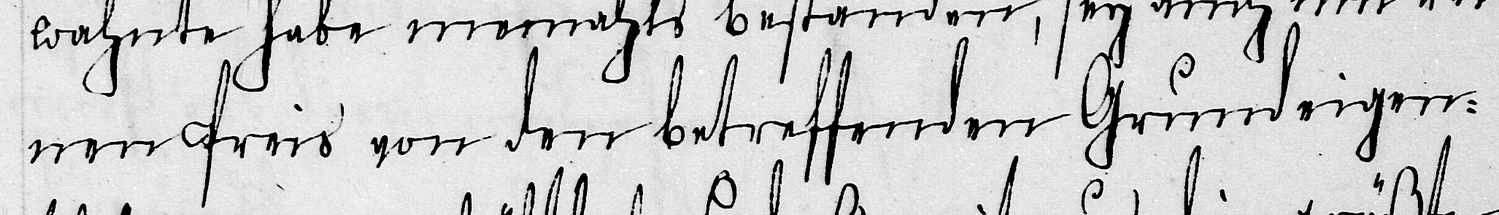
nen Preis von den betreffenden Grundeigen¬
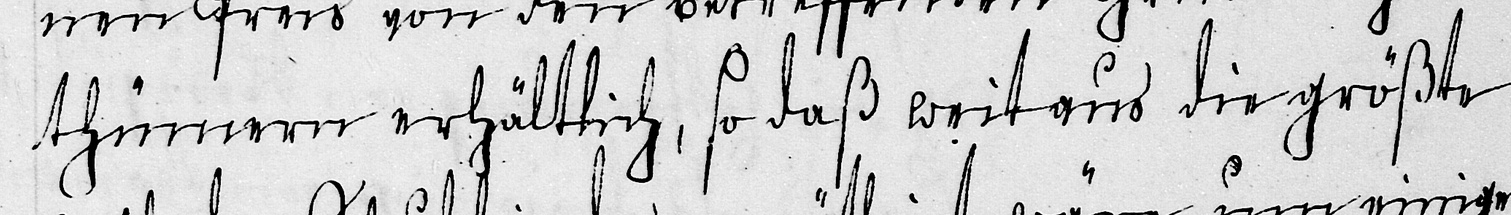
thümern erhältlich, so daß weitaus die größte
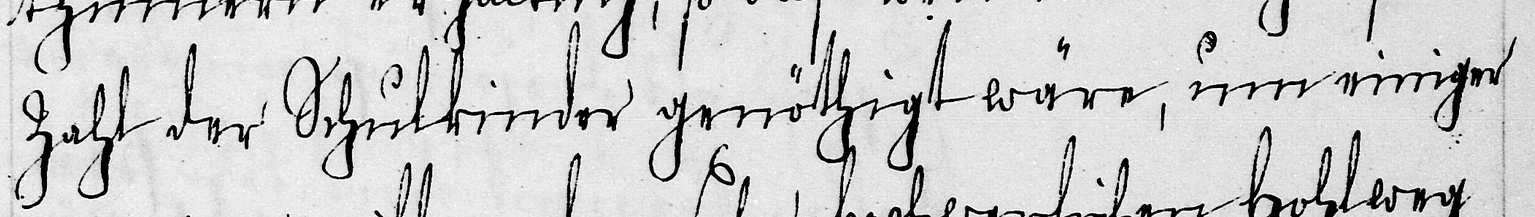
Zahl der Schulkinder genöthigt wäre, um einiger
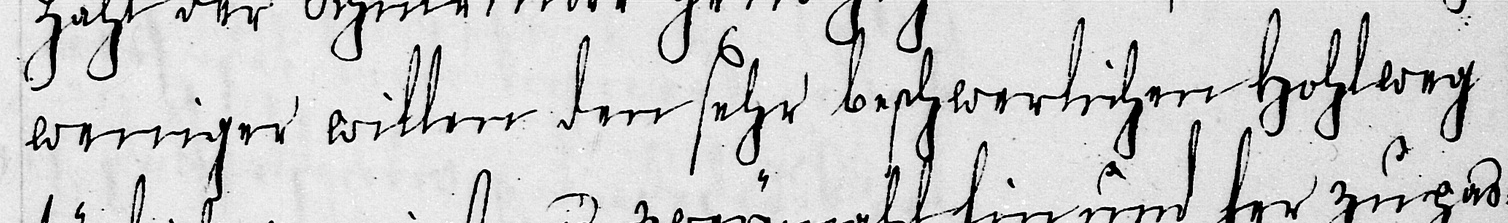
weniger willen den sehr beschwerlichen Hohlweg
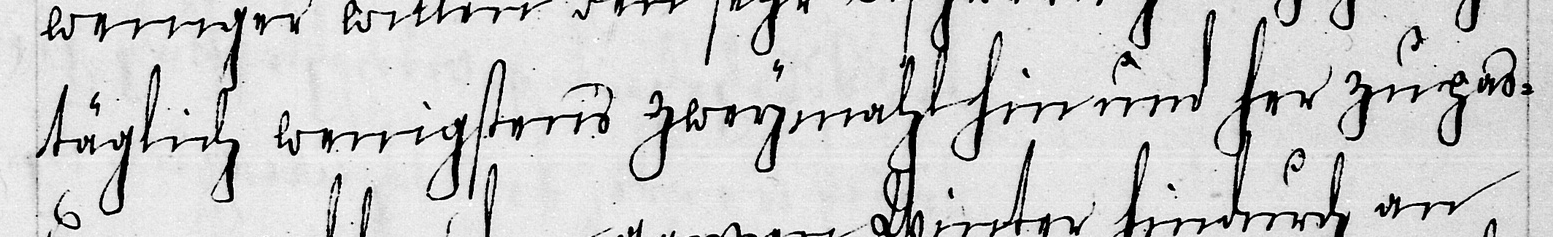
täglich wenigstens zweymahl hin und her zu paß¬
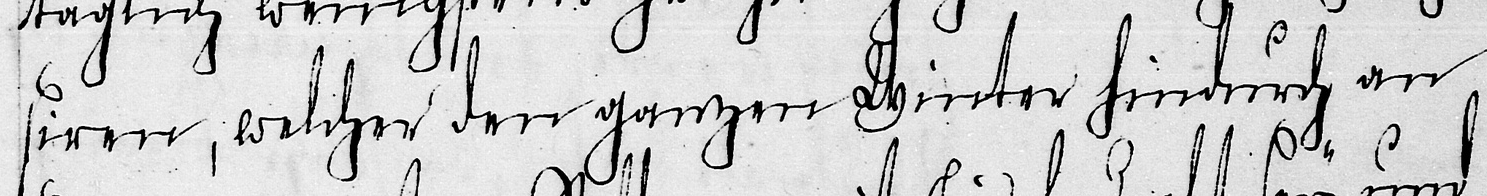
iren, welcher den ganzen Winter hindurch an
